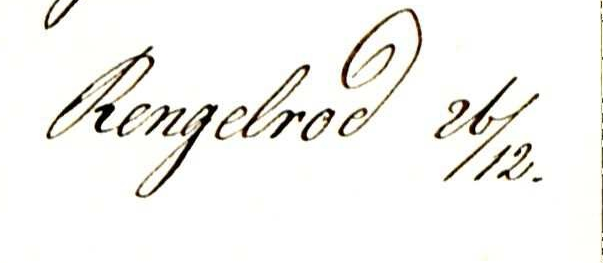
Rengelrod 26/12
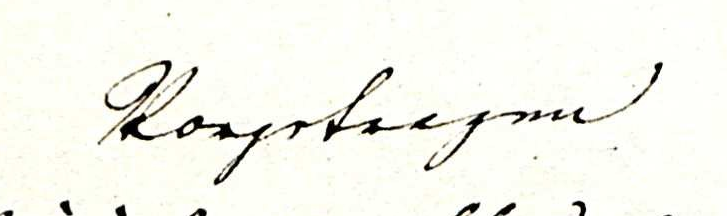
Vorgetragen
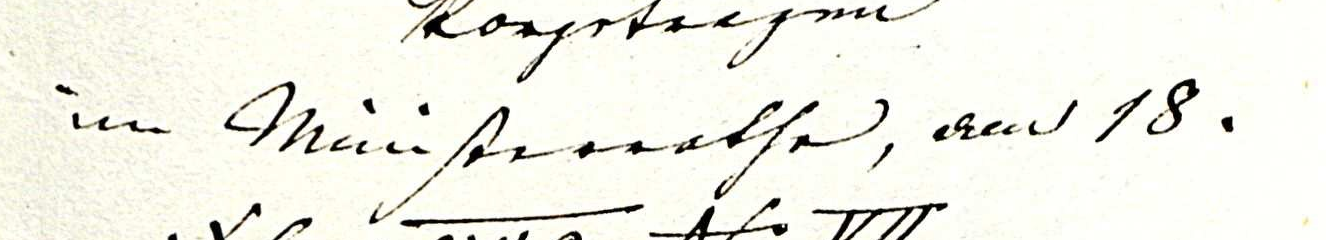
m Ministerrathe, am 18.
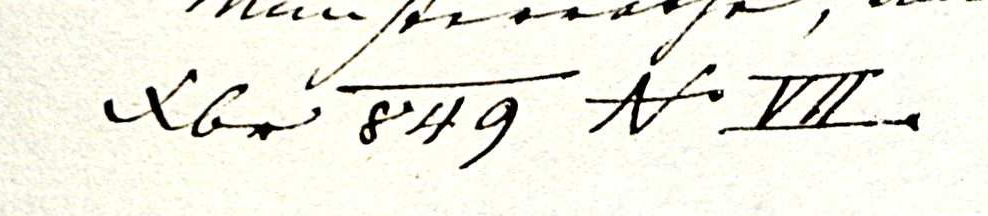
Xbr 849 No VII
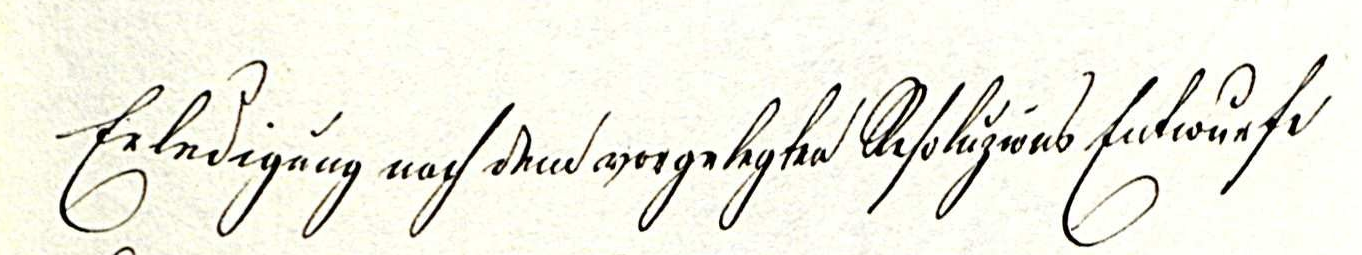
Erledigung nach dem vorgelegten Resoluzions Entwurfe
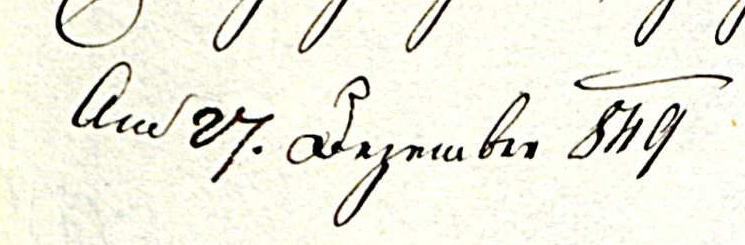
Am 27. Dezember 849
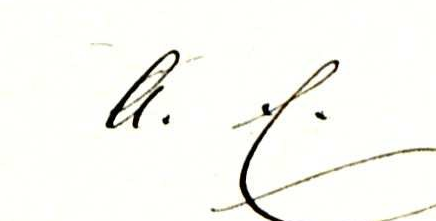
A. E.
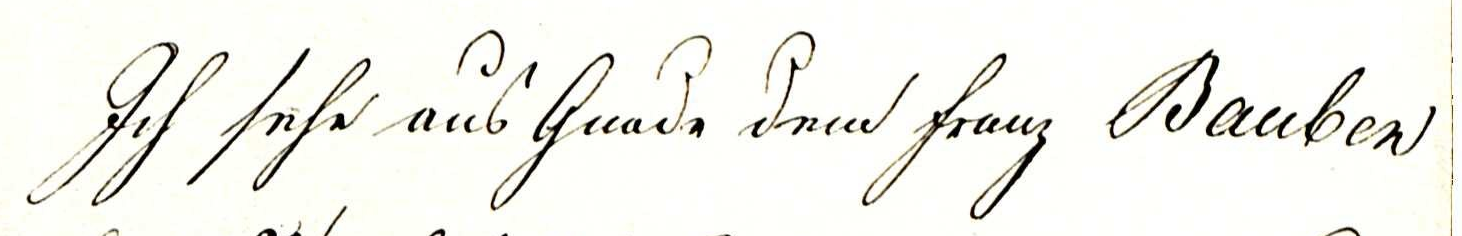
Ich sehe aus Gnade dem Franz Bauben
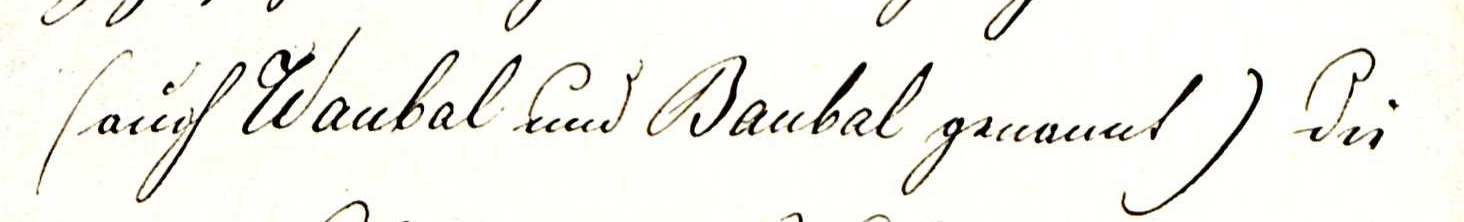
(auch Waubal und Baubal genannt) die
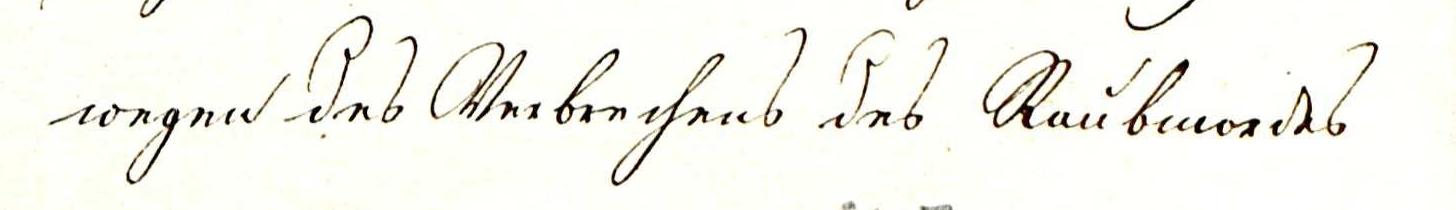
wegen des Verbrechens des Raubmordes
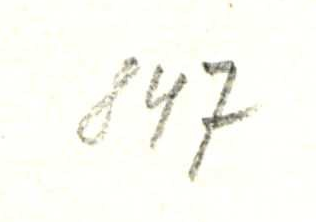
847
